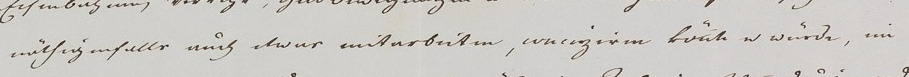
nöthigenfalls auch etwas mitarbeiten, concipiren könnte u würde, ein
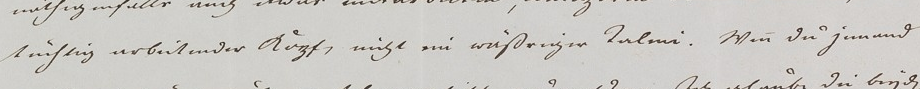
tüchtig arbeitender Kopf, nicht ein wäßriger Talmi. Wenn Du jemand
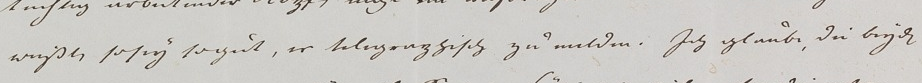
weißt, so sey so gut, es telegraphisch zu melden. Ich glaube, die beyden
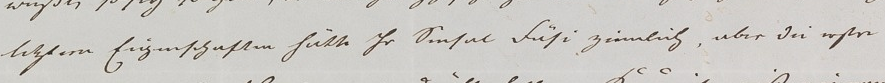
letztern Eigenschaften hätte Hr SensalFäsi ziemlich, aber die erstre
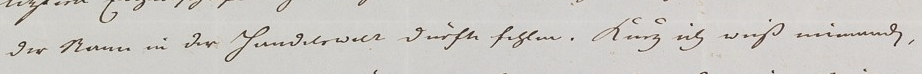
der Namen in der Handelswelt dürfte fehlen. Kurz ich weiß niemanden,
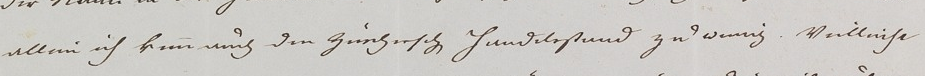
allein ich kenne auch den Zürcherschen Handelsstand zu wenig. Vielleicht
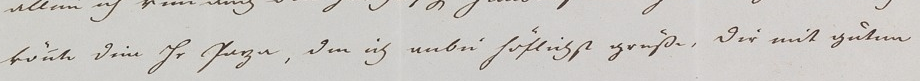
könnte Dein Hr. Papa, den ich anbei höflichst grüße, dir mit gutem
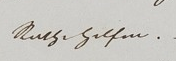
Rathe helfen. –
